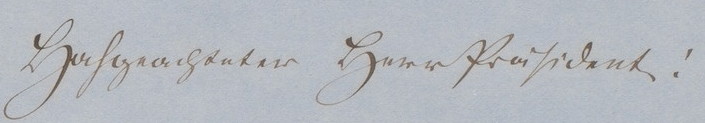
Hochgeachteter Herr Präsident!
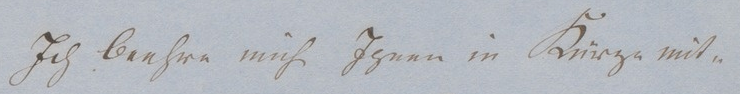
Ich beehre mich Ihnen in Kürze mit-
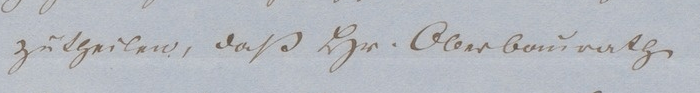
zutheilen, daß Hr. Oberbaurath
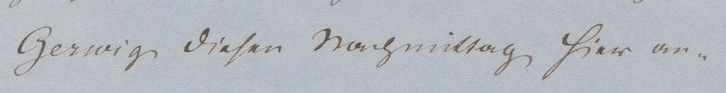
Gerwig diesen Nachmittag hier an-
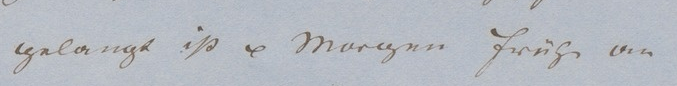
gelangt ist & Morgen früh an
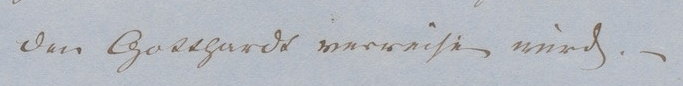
den Gotthardt verreisen wird. –
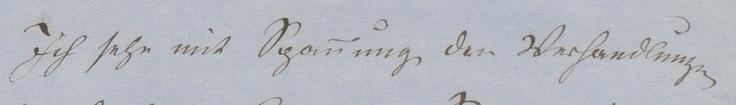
Ich sehe mit Spannung den Verhandlungen
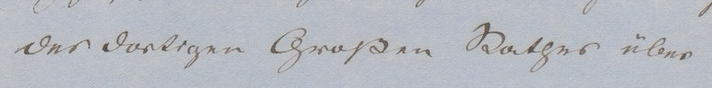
des dortigen Großen Rathes über
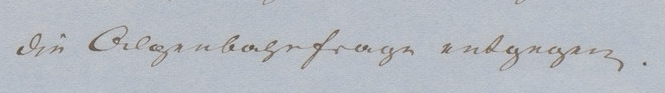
die Alpenbahnfrage entgegen.
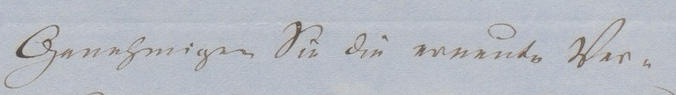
Genehmigen Sie die erneute Ver-
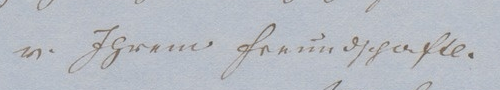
v. Ihrem freundschaftl.
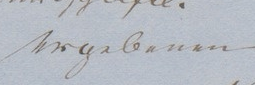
ergebenen
